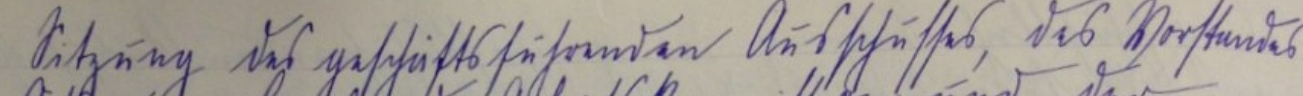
Sitzung des geschäftsführenden Ausschusses, des Vorstandes
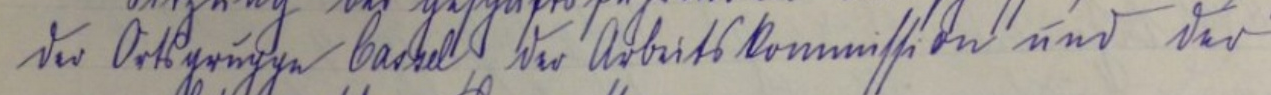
der Ortsgruppe Cassel, der Arbeitskommision und der
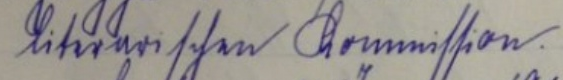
literarischen Kommision.
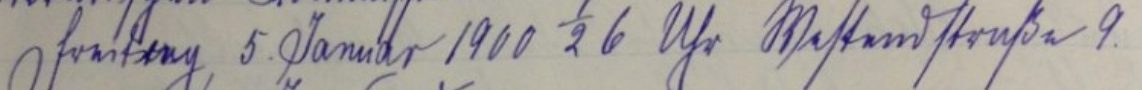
Freitag, 5. Januar 1900 ½ 6 Uhr Westendstraße 9
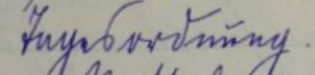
Tagesordnung
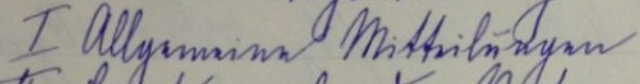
I Allgemeine Mitteilungen
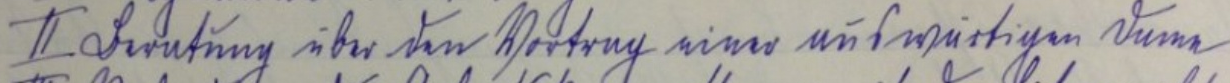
II Beratung über den Vortrag einer auswärtigen Dame
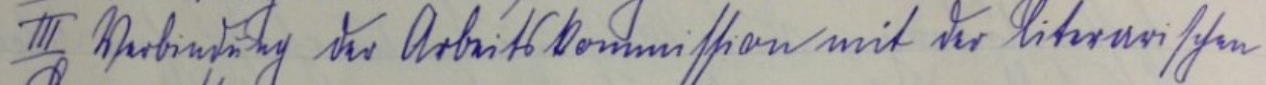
III Verbindung der Arbeitskommision mit der literarischen
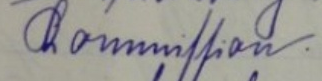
Kommision
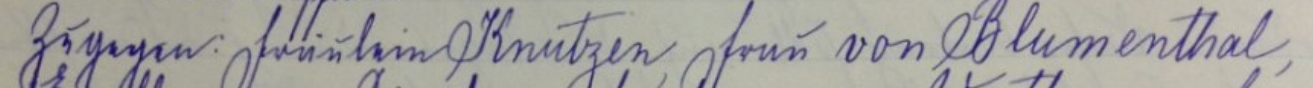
Zugegen: Fäulein Knutzen, Frau von Blumenthal,
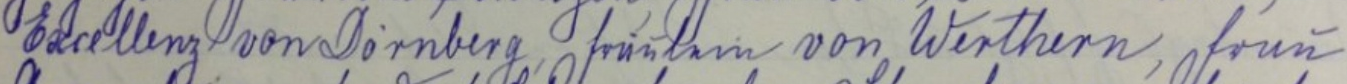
Exzellenz von Dornberg, Fräulein von Werthern, Frau
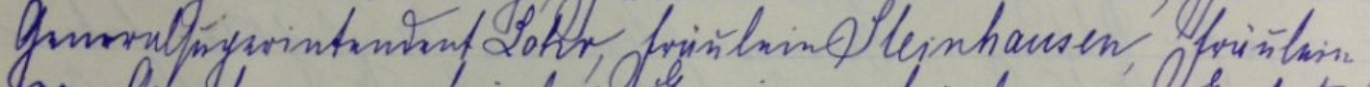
Generalsuperintendent Lohr, Fräulein Steinhausen, Fräulein
